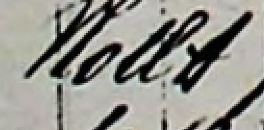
Noll
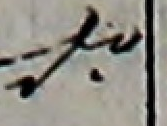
Do
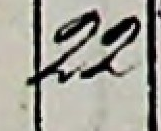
22
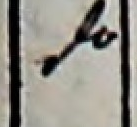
Do
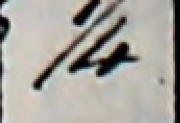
1/4
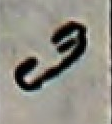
3
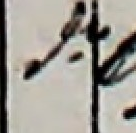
Do
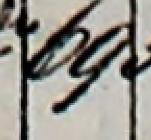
69
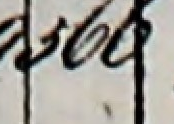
566
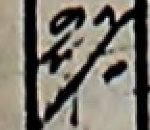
27
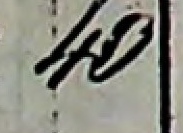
40
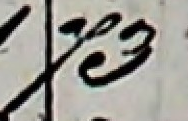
73
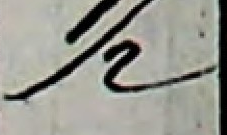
1/2
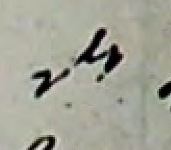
Do
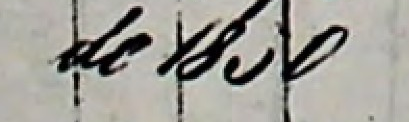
de 1830
